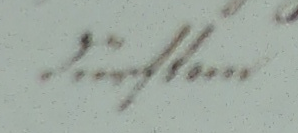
dürften
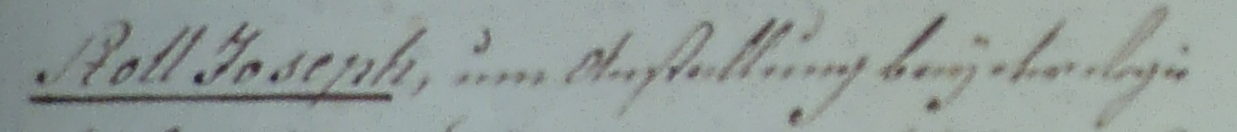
Stoll Joseph, um Anstellung bey der Regie
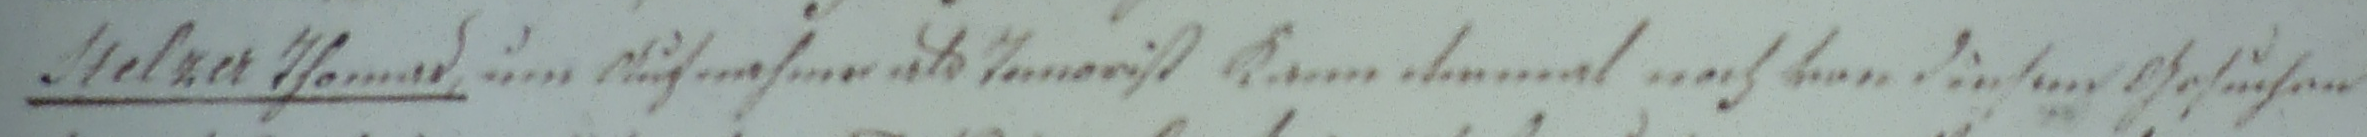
Stelzer Thomas, um Aufnahme als Tenorist
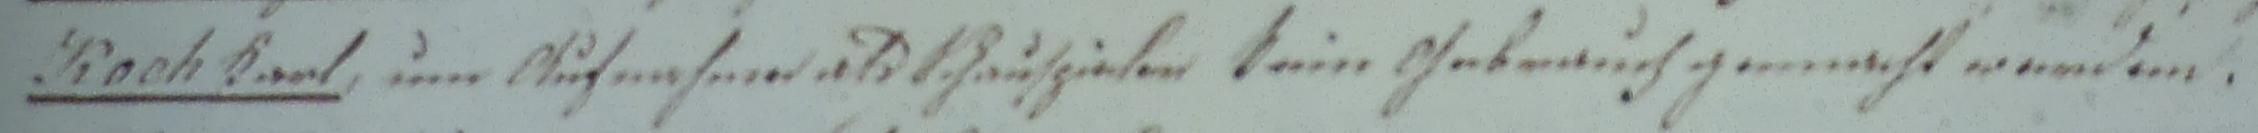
Koch Karl, um Aufnahme als Schauspieler
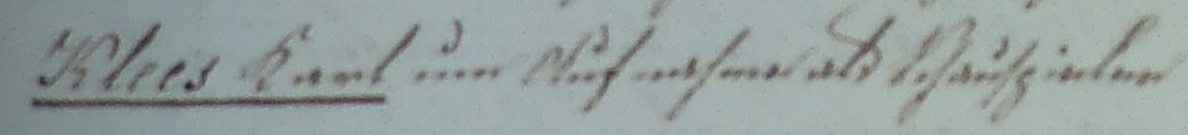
Klees Karl um Aufnahme als Schauspieler
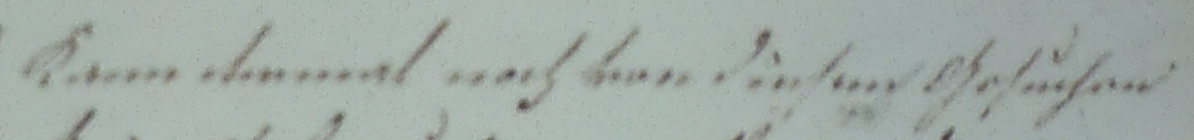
Kann dermal noch von diesen Gesuchen
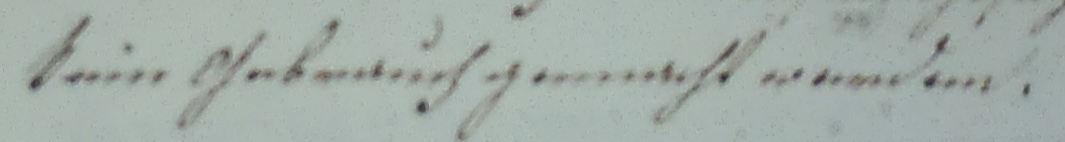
kein Gebrauch gemacht werden.
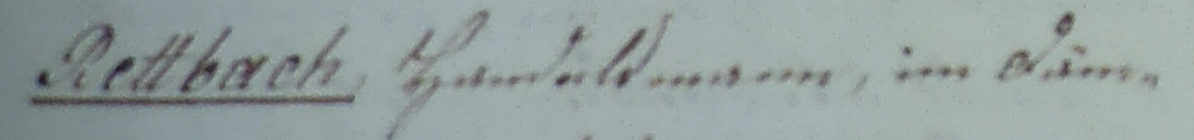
Rettbach, Handelsmann, im Däm¬
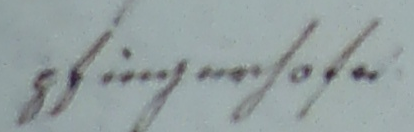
pfingerhofe
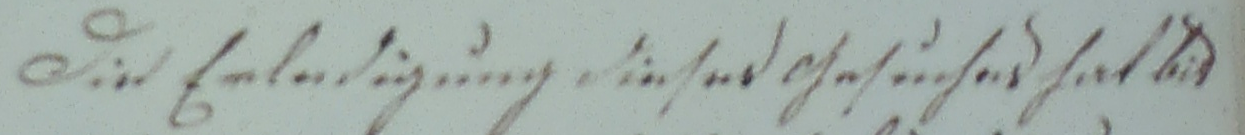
Die Erledigung dieses Gesuches hat bis
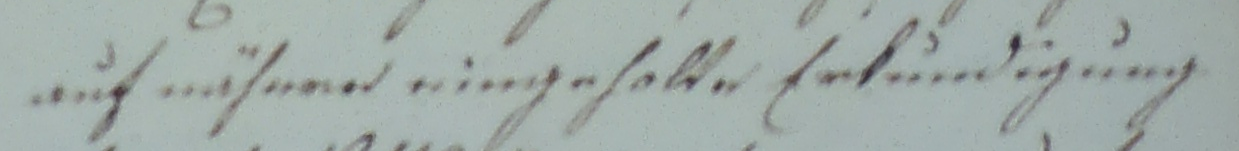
auf nähere eingeholte Erkundigungen
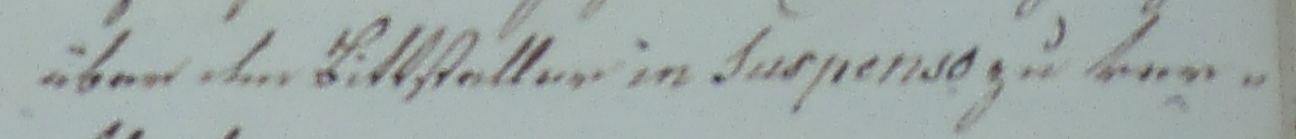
über den Bittsteller in Suspenso zu ver¬
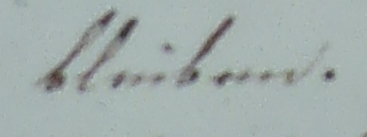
bleiben.
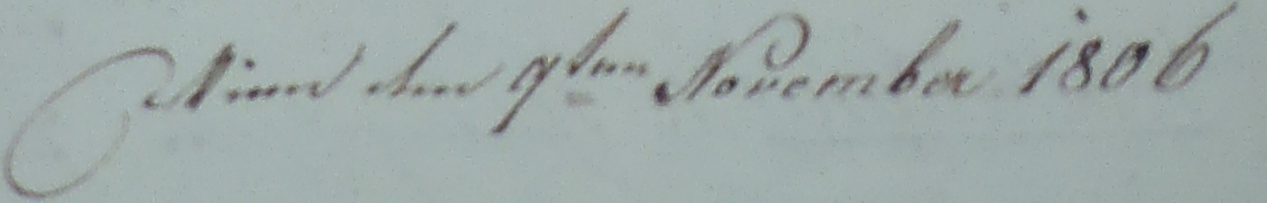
Wien den 9te͇n November 1806
